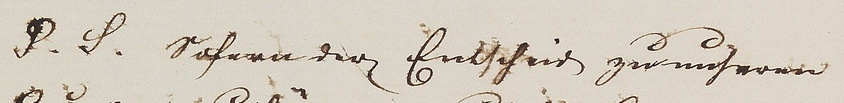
P. S. Sofern der Entscheid zu unseren
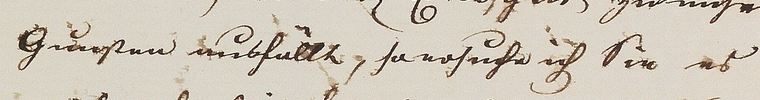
Gunsten ausfällt, so ersuche ich Sie es
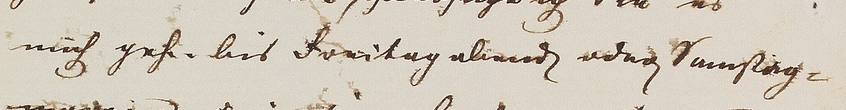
mich gef. bis Freitag abend oder Samstag -
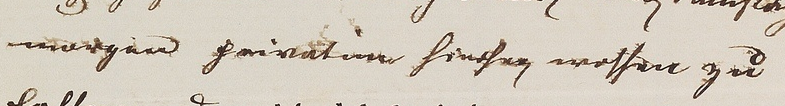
morgen privatim hierher wissen zu
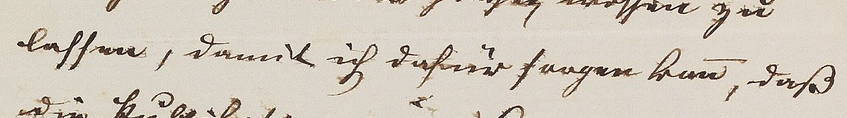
lassen, damit ich dafür sorgen kann, daß
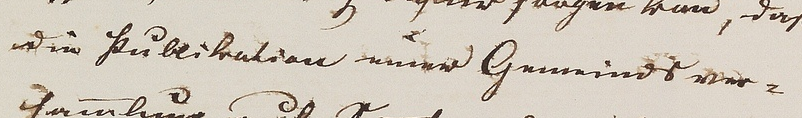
die Publikation einer Gemeindsver-
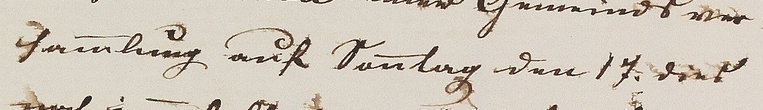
sammlung auf Sonntag den 17. dies
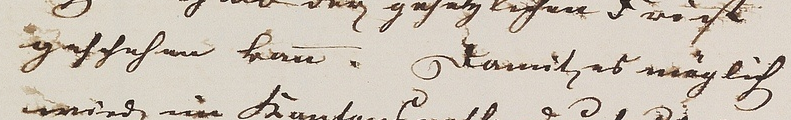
geschehen kann. Damit es möglich
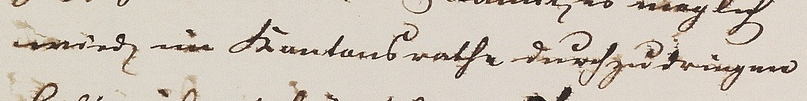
wird, im Kantonsrathe durchzudringen
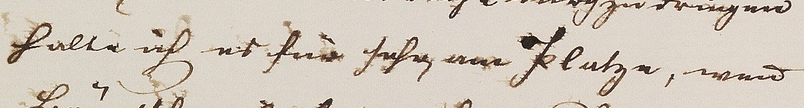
halte ich es für sehr am Platze, wenn
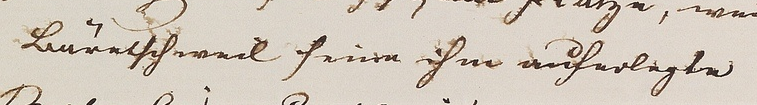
Bäretschweil seine ihm auferlegte
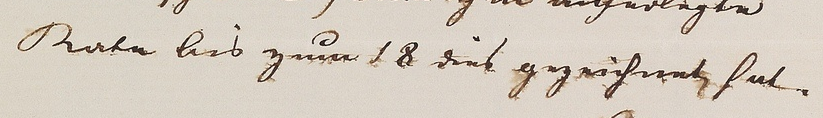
Rate bis zum 18 dies gezeichnet hat.
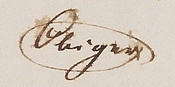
Obiger
